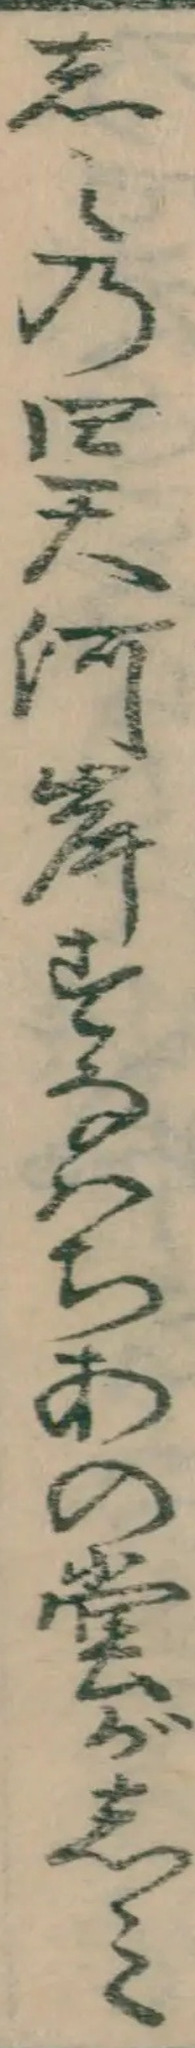しみの四天河岸すなはちあの堂がしみ

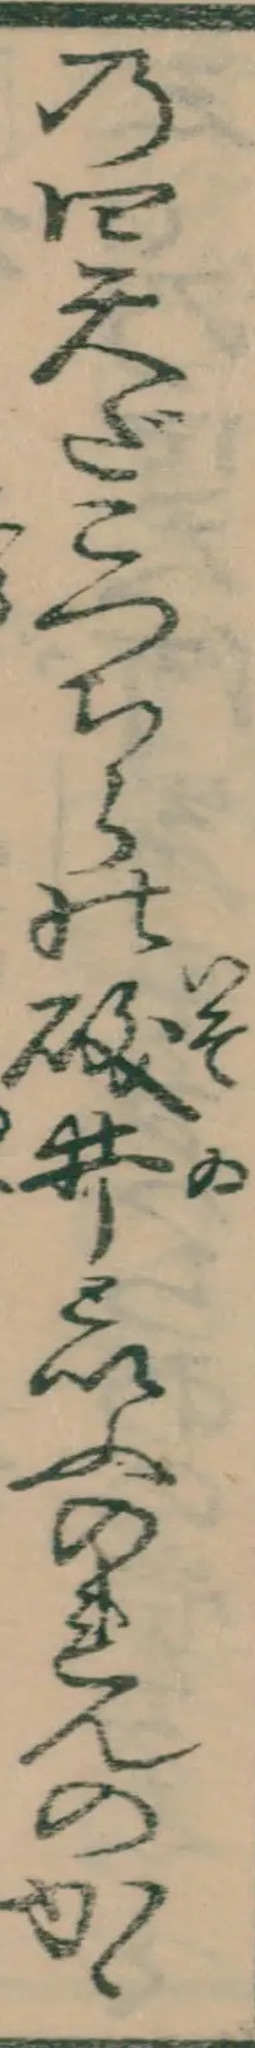の四天だこつちらの磯井といふのれんのかゝ
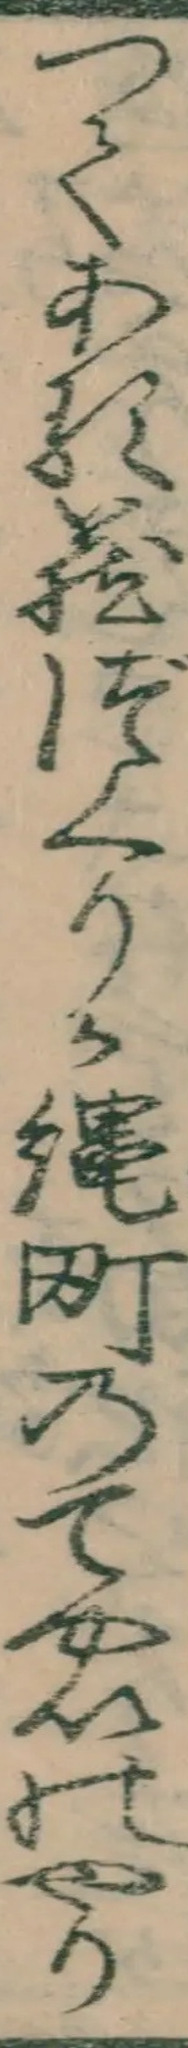つてある蔵づくりか縄町のてやいのやり
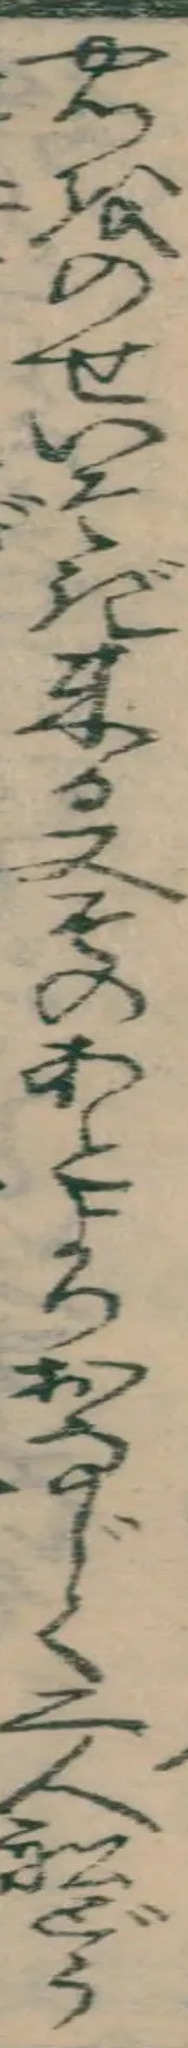やつをのせいそぎ来る又そのあとよりおなじく二人船どう
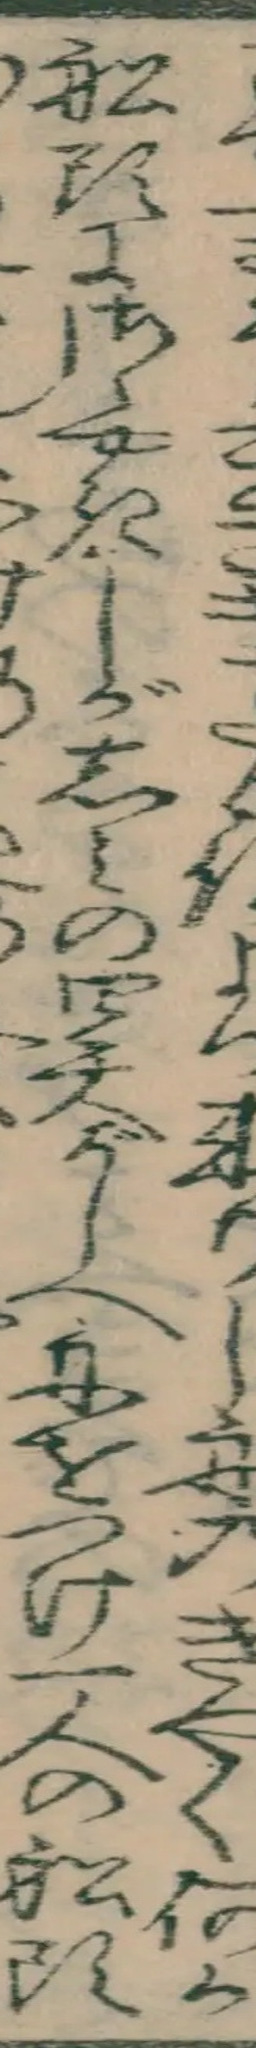船頭にさゝやきしがしみの四天がしへ舟をつけ一人の船頭
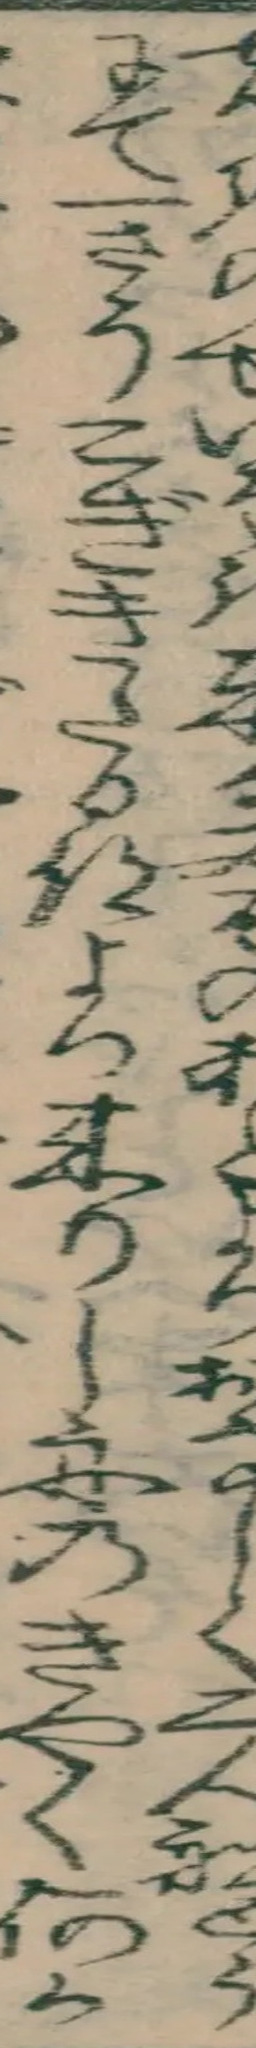にて一さうこぎきたる跡より来りし舟のきやく何か
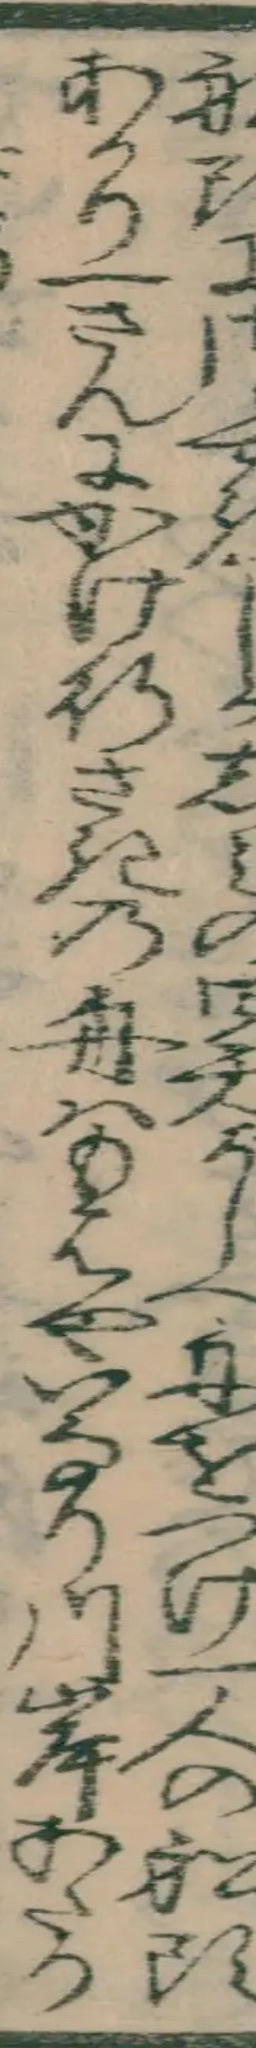あかり一さんにかけ行さきの舟はもはやいなり川岸あたり
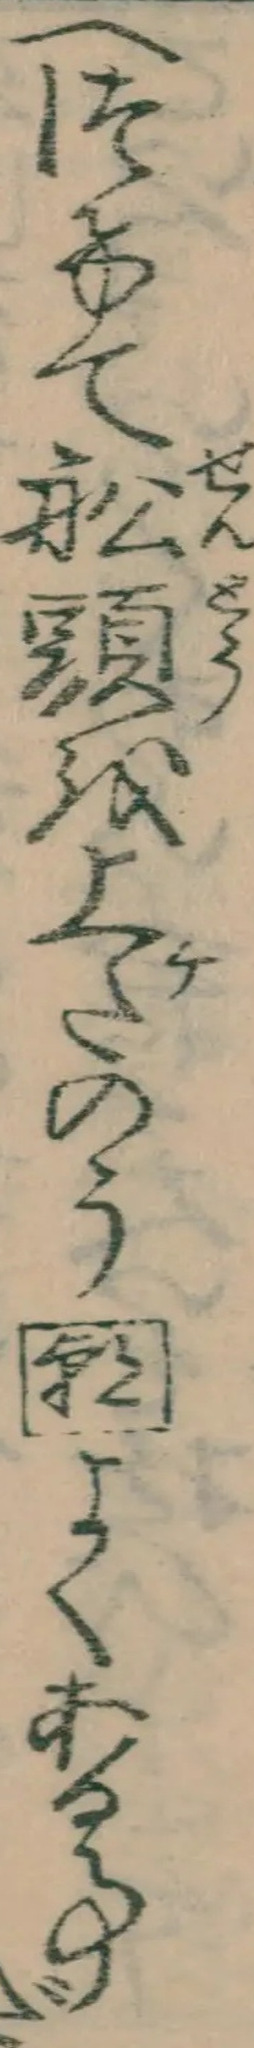へつけて船頭を上けたのう〈朝〉よくある事だ
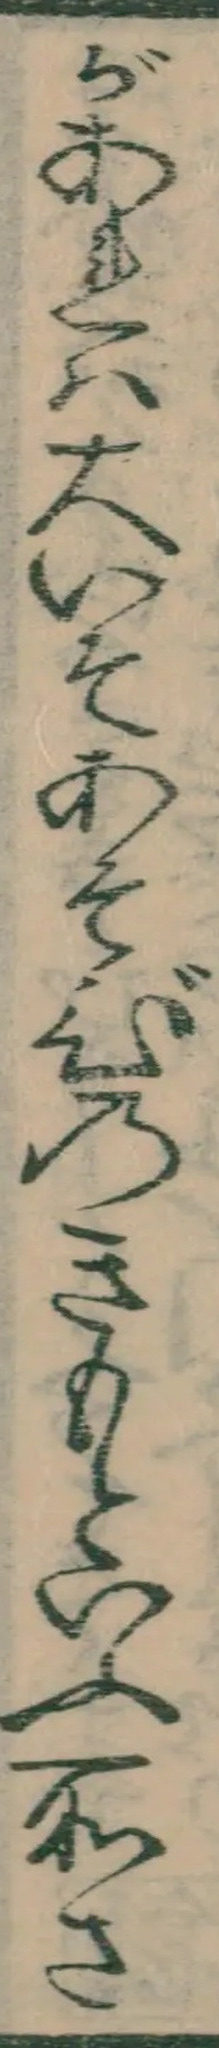があれは大いそあそびのきもといふ所さ
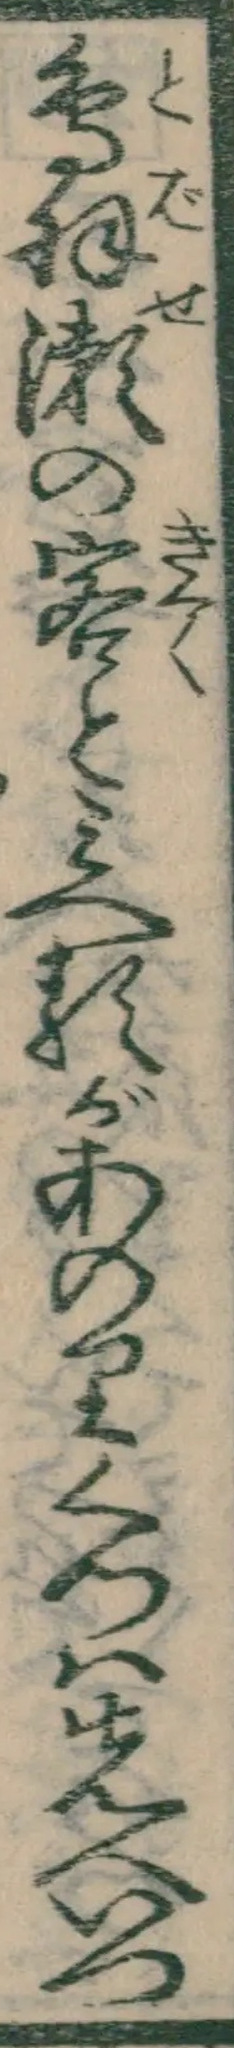鳥羽瀬の客とみへるがあのりくつは先へいつ
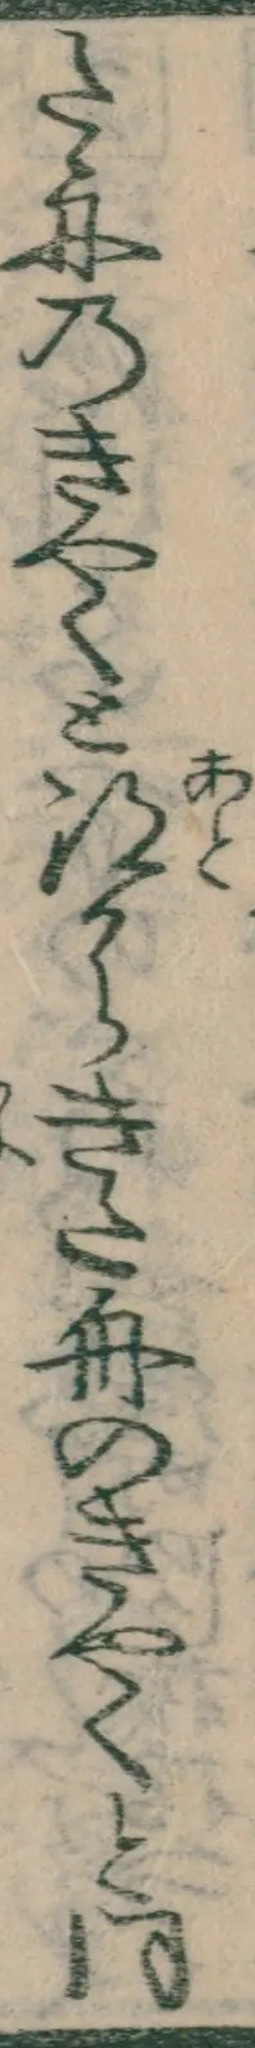た舟のきやくと跡からきた舟のきやくと同
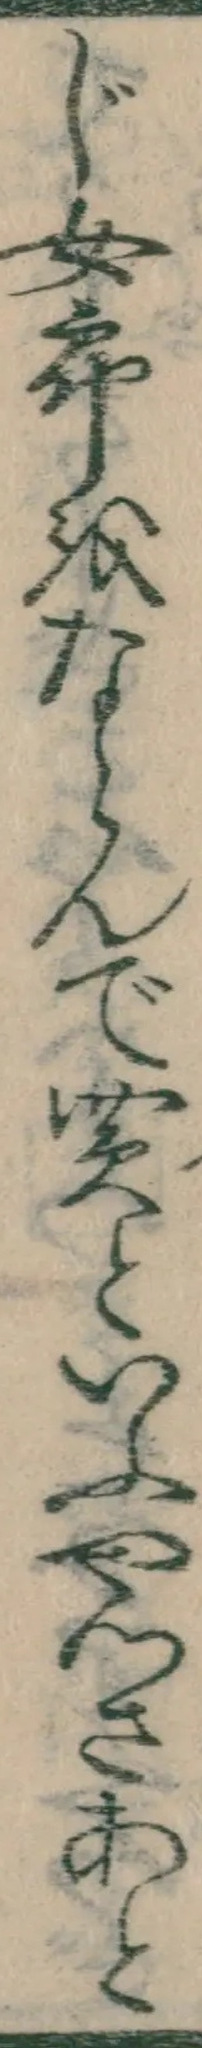じ女郎をならんで買といふやつさあと
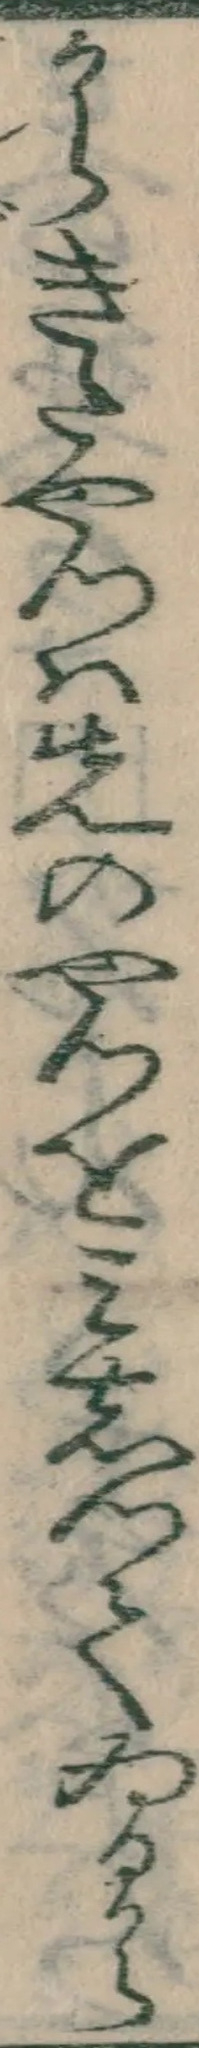からきたやつは先のやつをみしつてゐるから
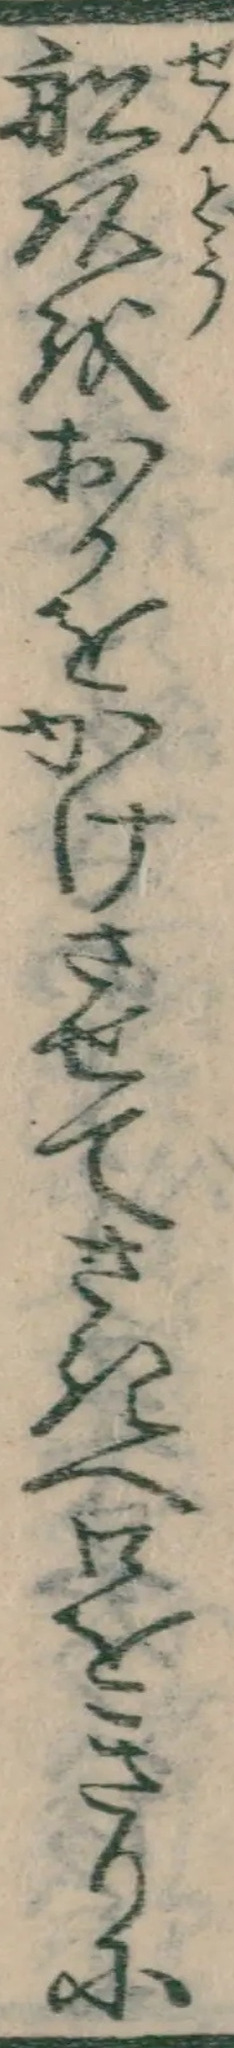船頭をおかをかけさせてさきへ口をきりに
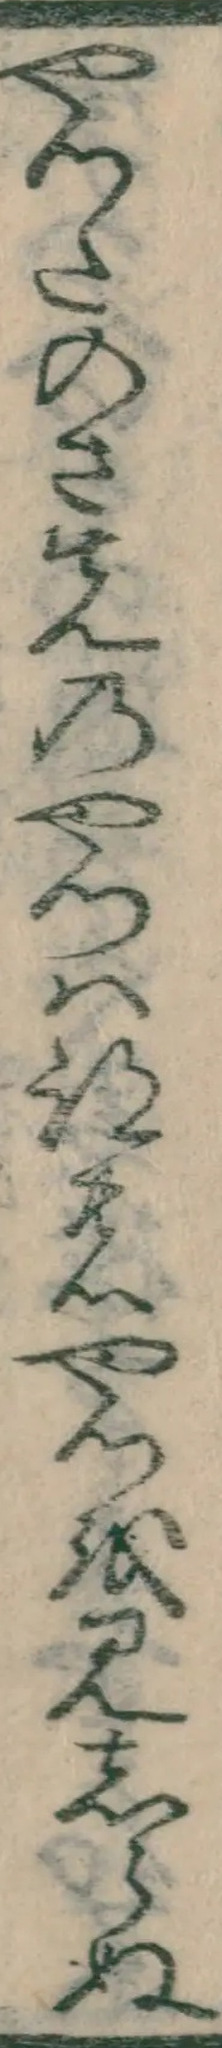やつたのさ先のやつは跡のやつを見しらぬ
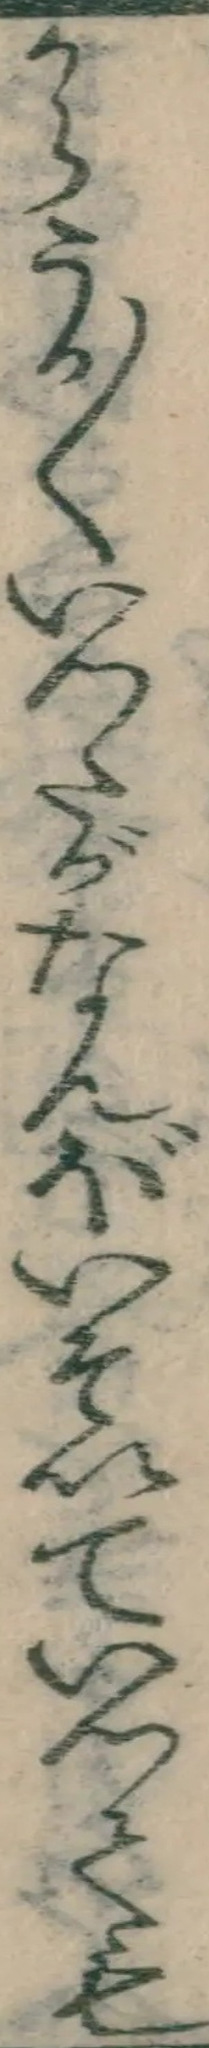からうか〳〵いつたがなんぽいそいていつても
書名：教訓読本：大礒風俗仕懸文庫
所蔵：国立国会図書館 National Diet Library, JAPAN
